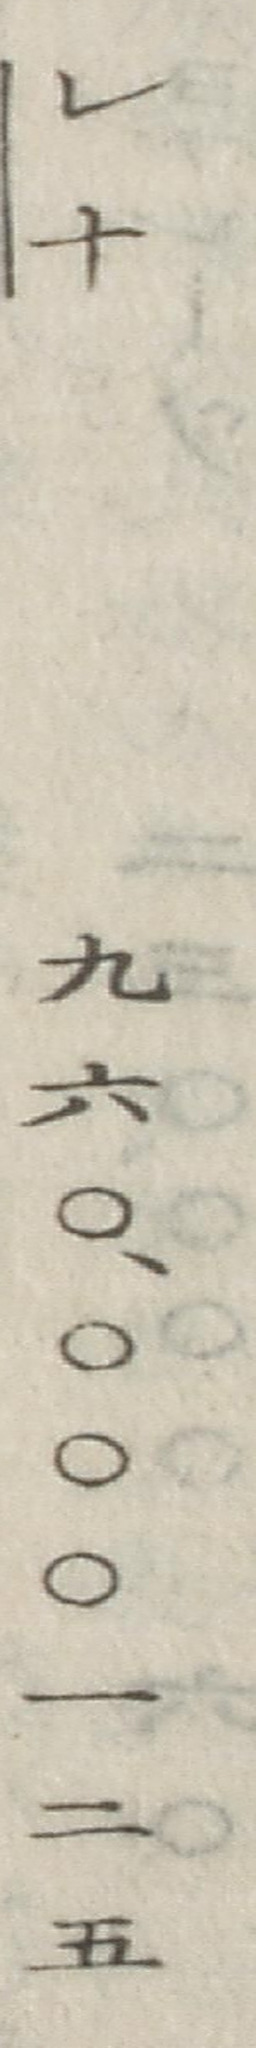レナ九六〇、〇〇〇一二五
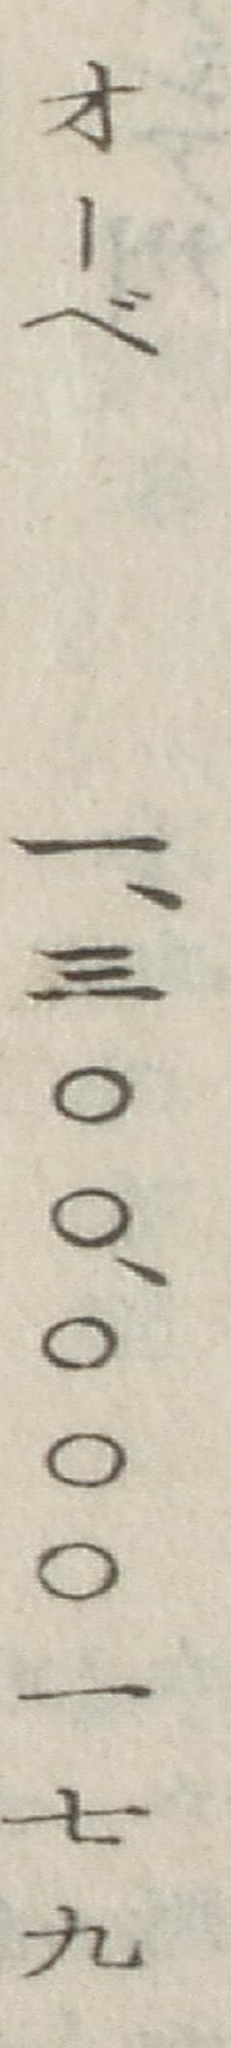オーベ一、三〇〇、〇〇〇一七九
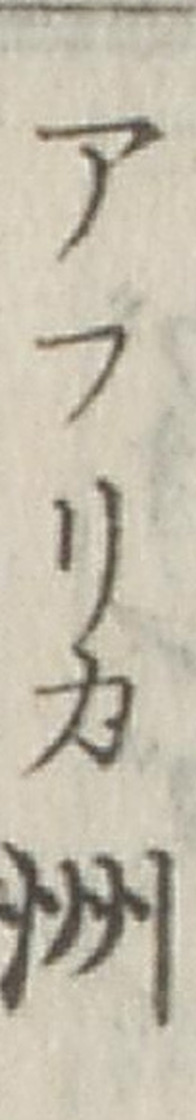アフリカ洲
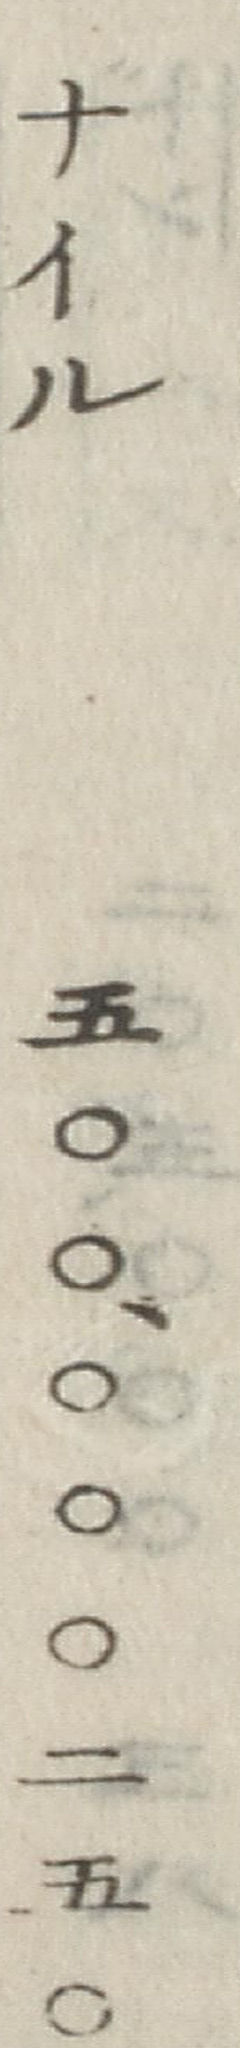ナイル五〇〇、〇〇〇二五〇
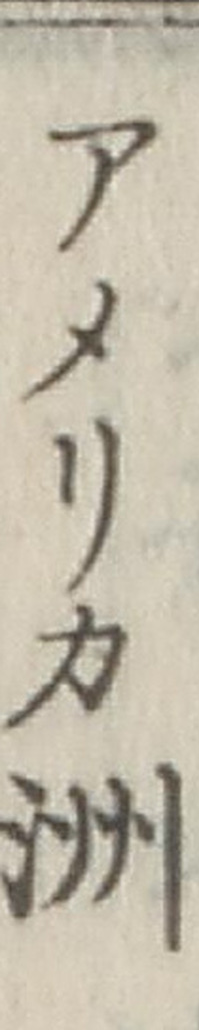アメリカ洲
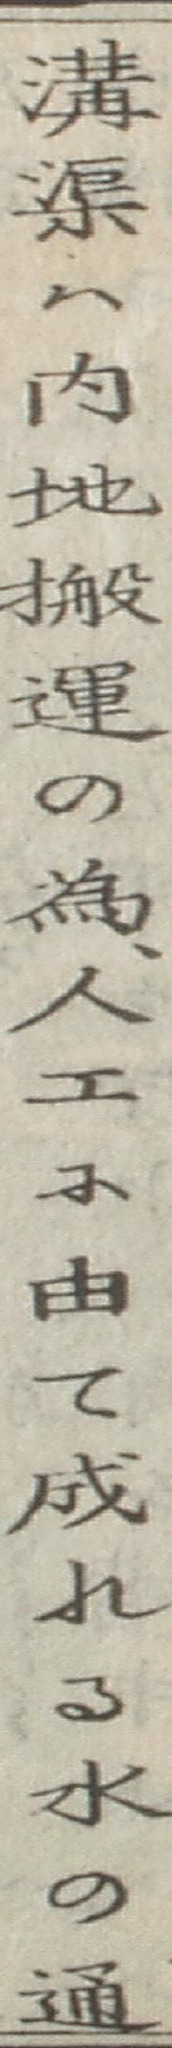溝渠は内地搬運の為、人工に由て成れる水の通
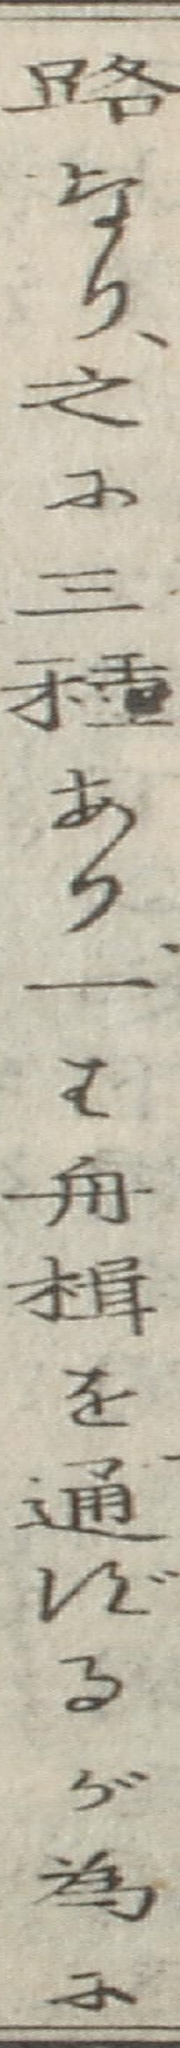路なり、之に三種あり、一は舟楫を通ずるが為に
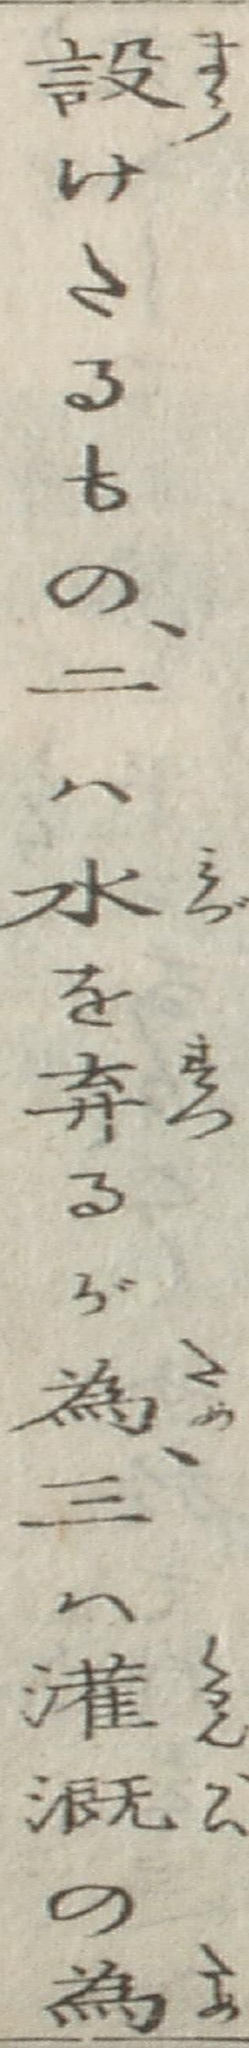設けたるもの、二は水を棄るが為、三は灌漑の為
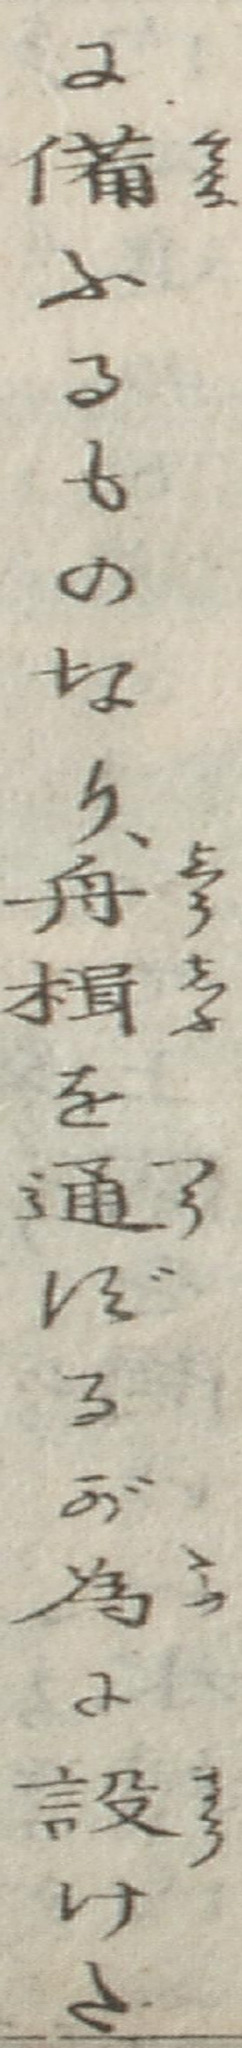に備ふるものなり、舟楫を通ずるが為に設けた
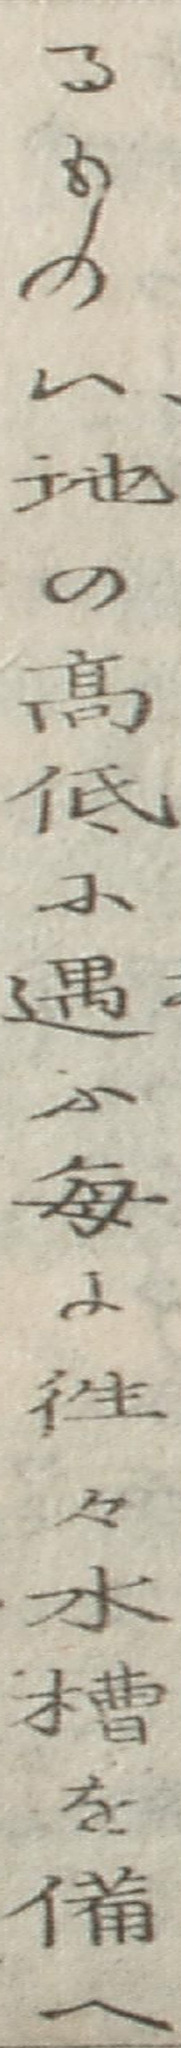るものは、地の高低に遇ふ毎に往々水槽を備へ、
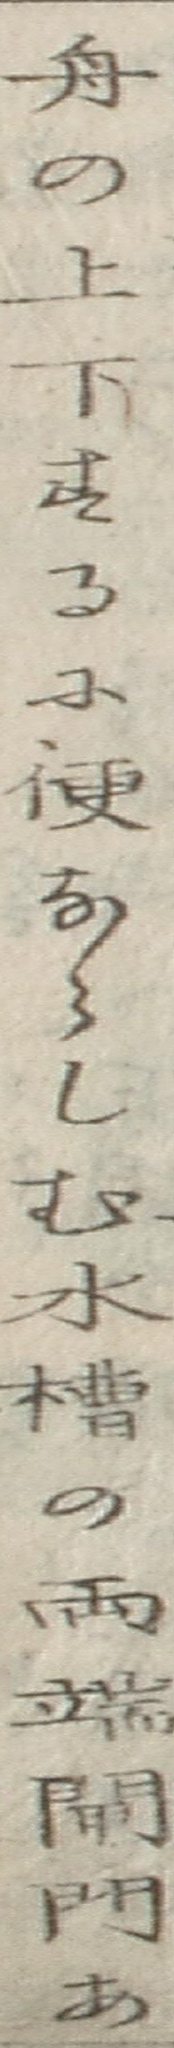舟の上下するに便ならしむ、水槽の両端閘門あ

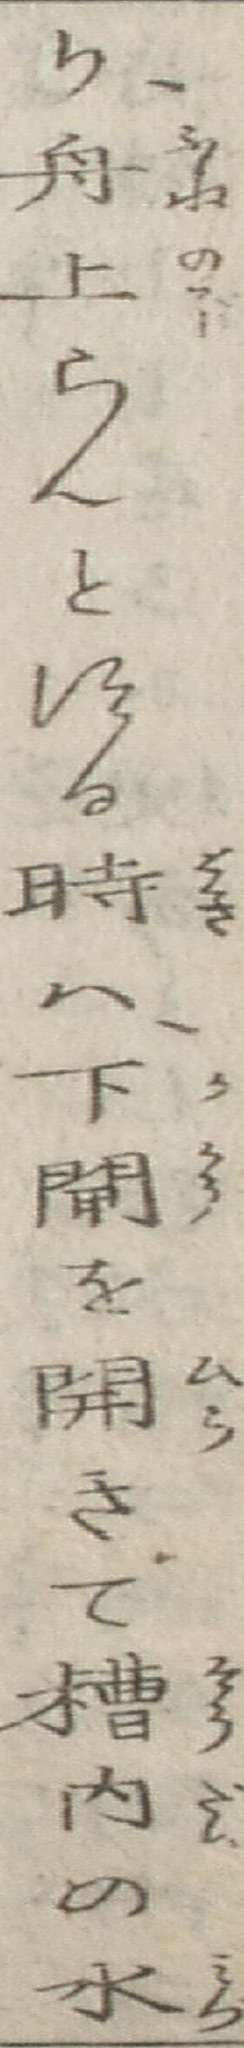り、舟上らんとする時は、下閘を開きて槽内の水
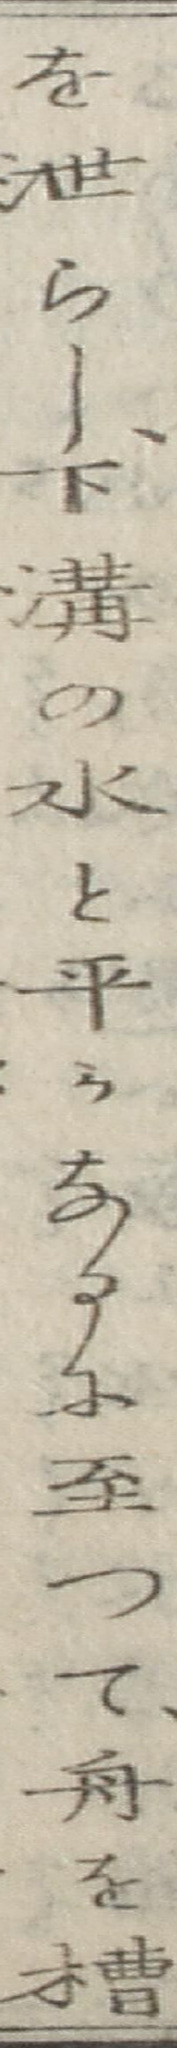を泄らし、下溝の水と平かなるに至つて、舟を槽
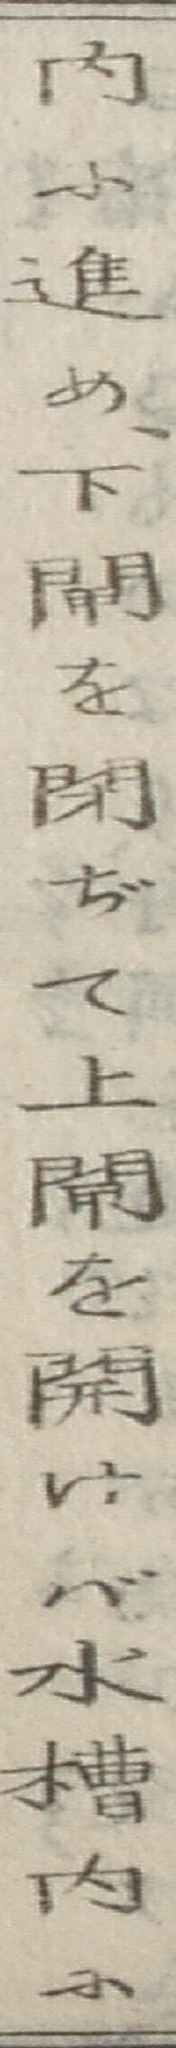内に進め、下閘を閉ぢて上閘を開けば、水槽内に
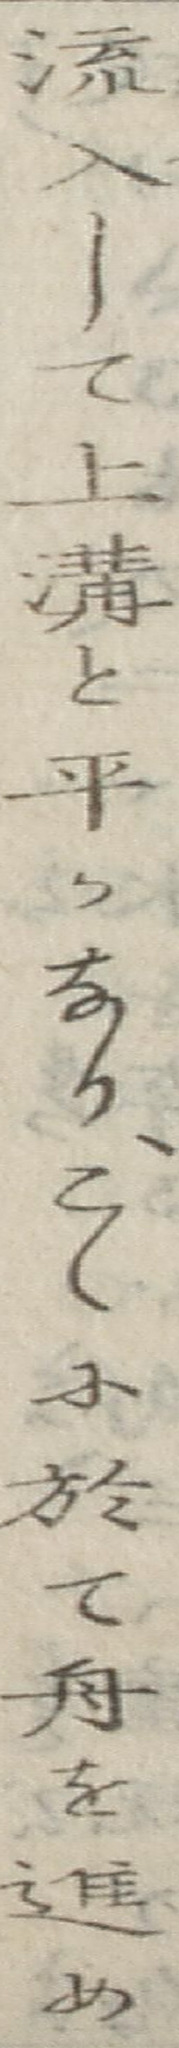流入して上溝と平なり、こゝに於て舟を進め
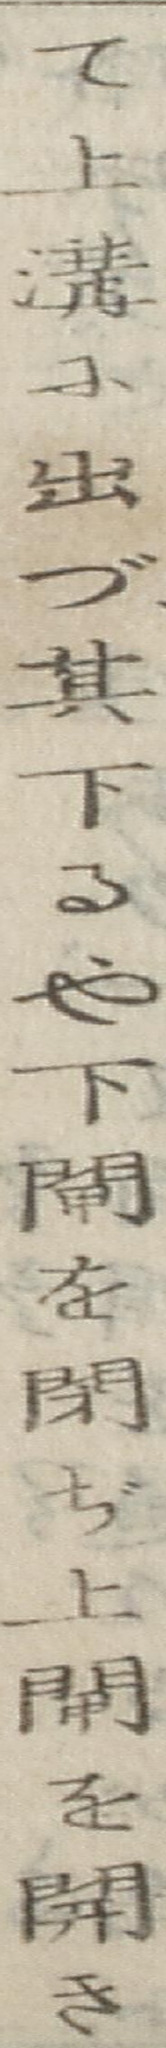て上溝に出づ、其下るや下閘を閉ぢ上閘を開き、
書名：訓蒙　天然地理學　中
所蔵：東京大学地震研究所図書室 Earthquake Research Institute Library, The University of Tokyo, JAPAN
